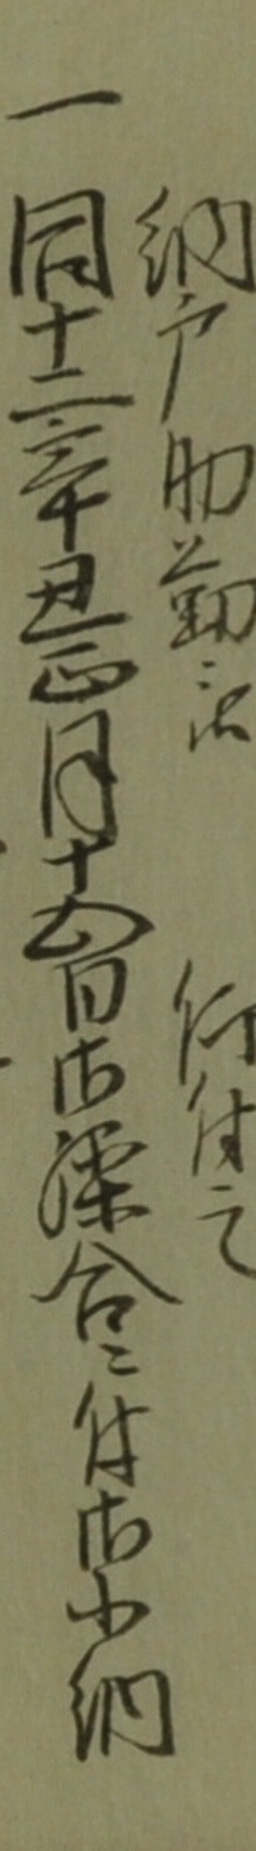一同十二辛丑正月十五日御繰合ニ付御小納
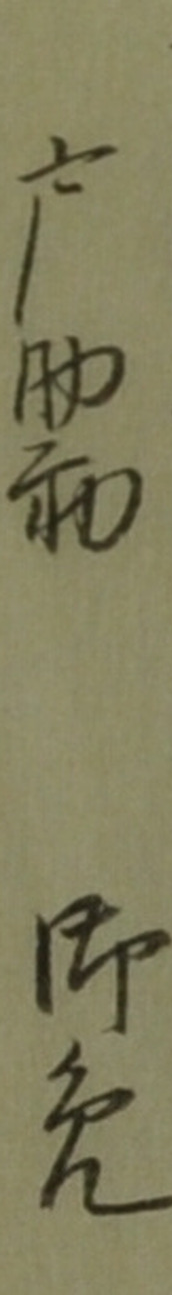戸助勤御免

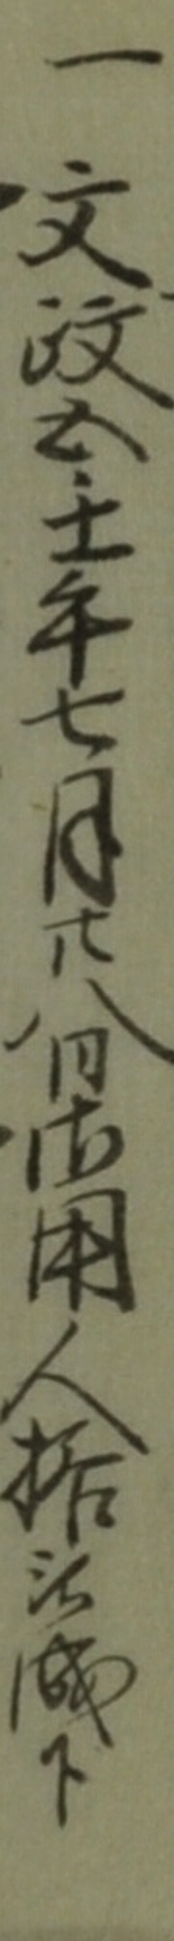一文政五壬午七月廿八日御用人格被成下
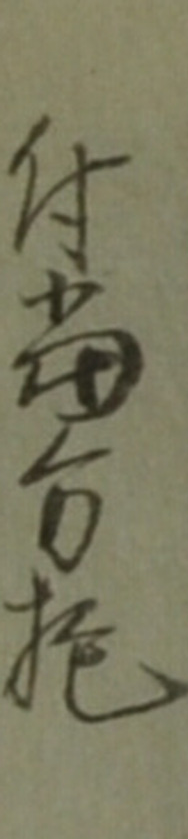付当分抱
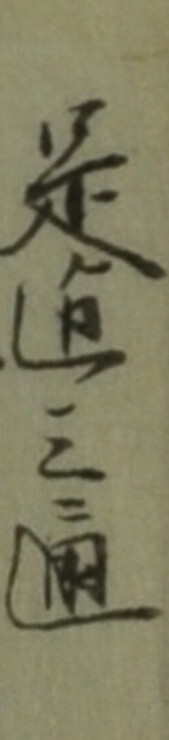是迄之通
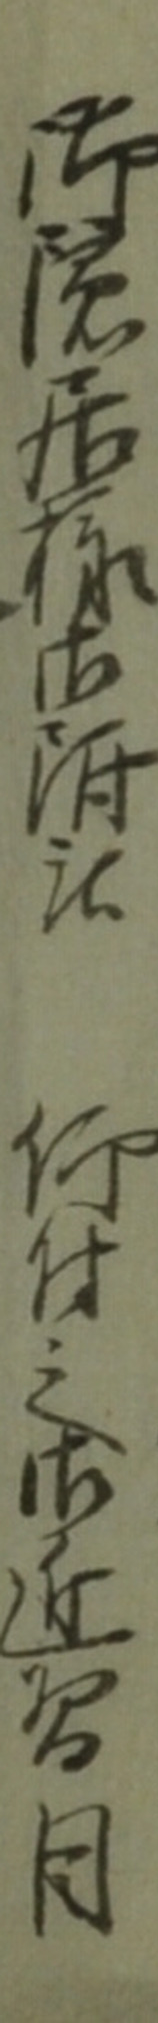御隠居様御附被仰付之御近習目
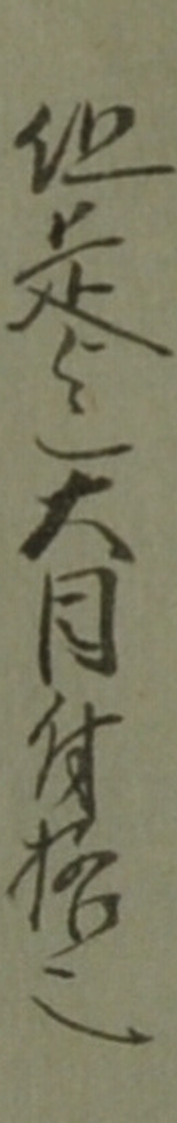但此迄大目付格也
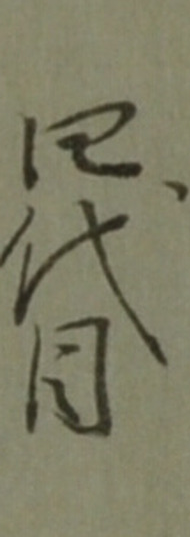四代目
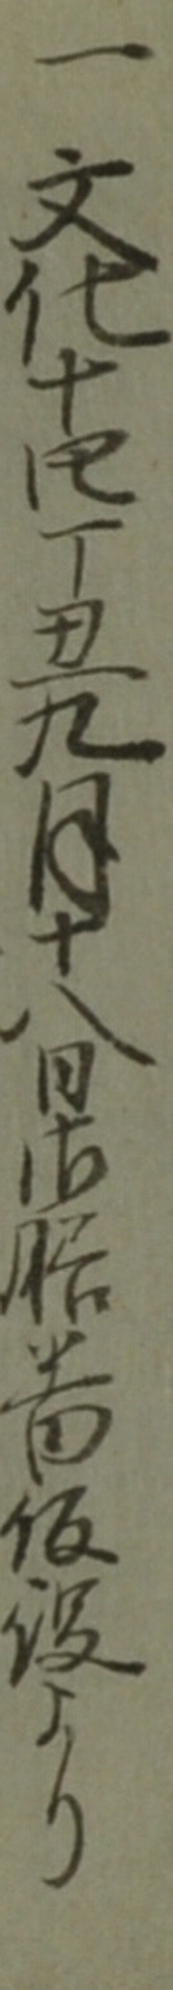一文化十四丁丑九月十八日御膳番仮役より
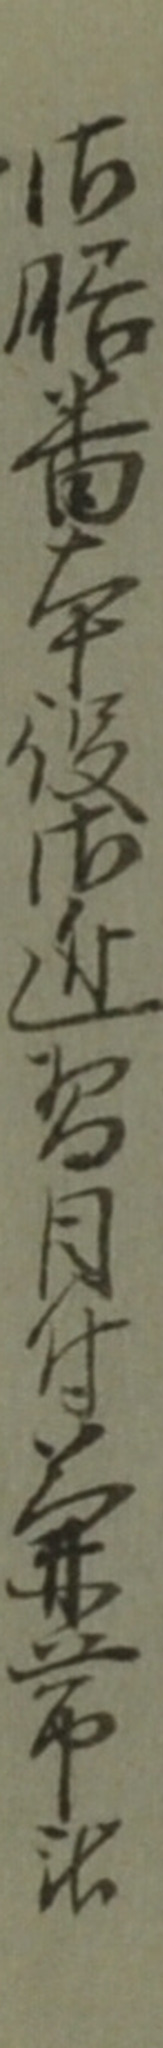御膳番本役御近習目付兼帯被
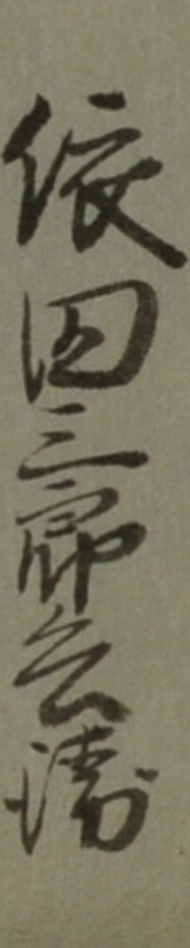依田三郎兵衛
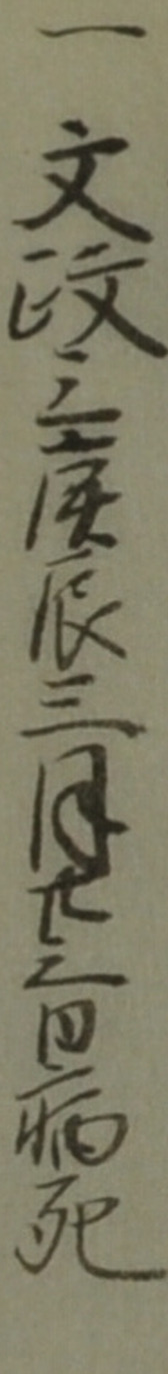一文政三庚辰三月廿三日病死
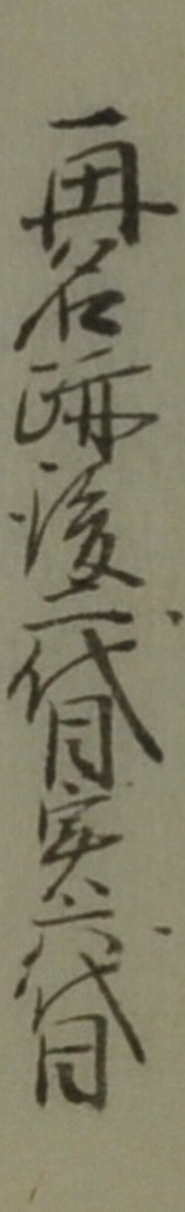再名跡後二代目実六代目
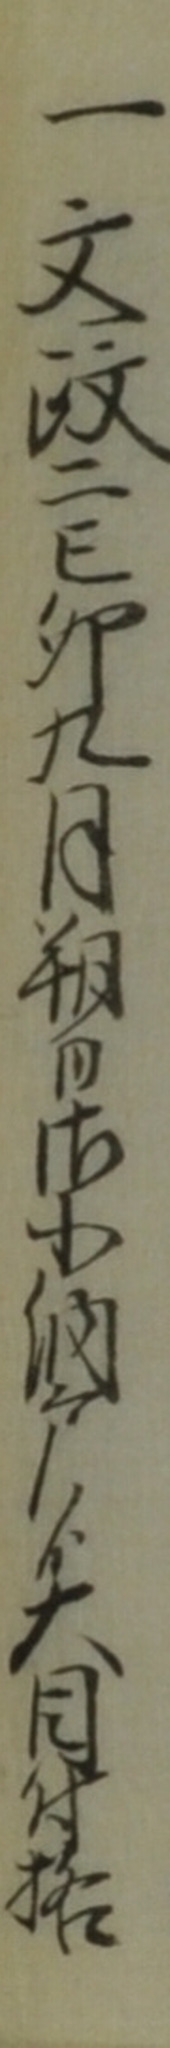一文政二己卯九月朔日御小納戸ゟ大目付格
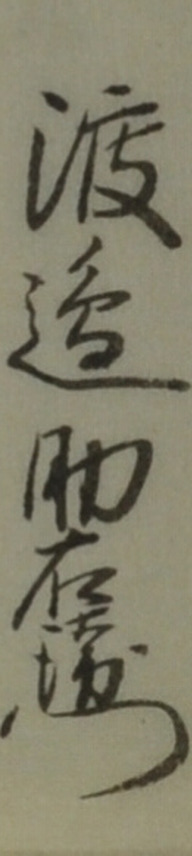渡辺助右衛門
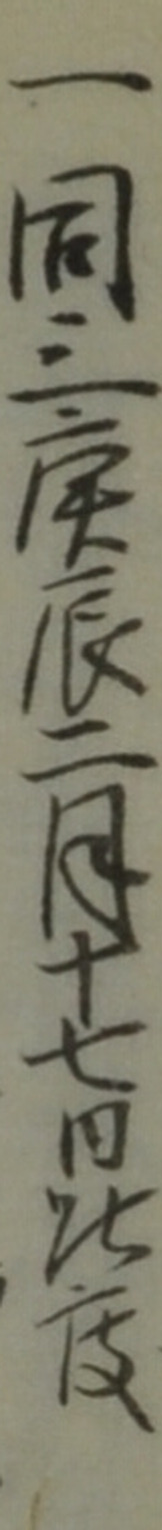一同三庚辰二月十七日此度
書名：諸御役代々録（四）
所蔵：伊那市立高遠町図書館・合同会社AMANE
